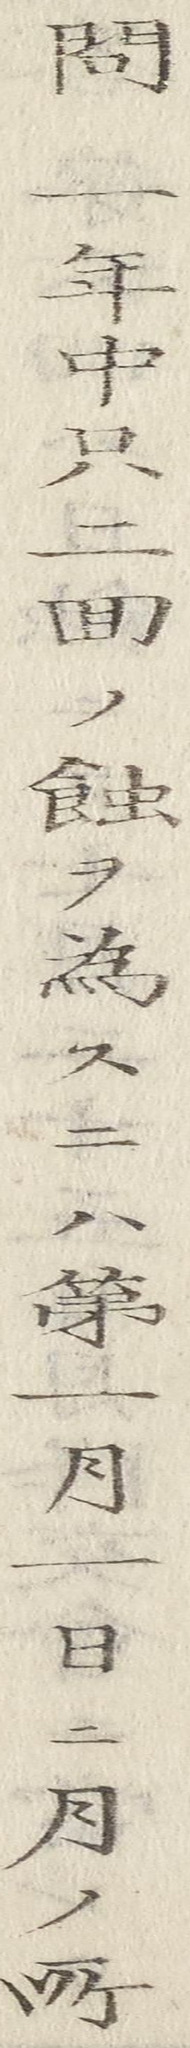問一年中只二回ノ蝕ヲ為スニハ第一月一日ニ月ノ所
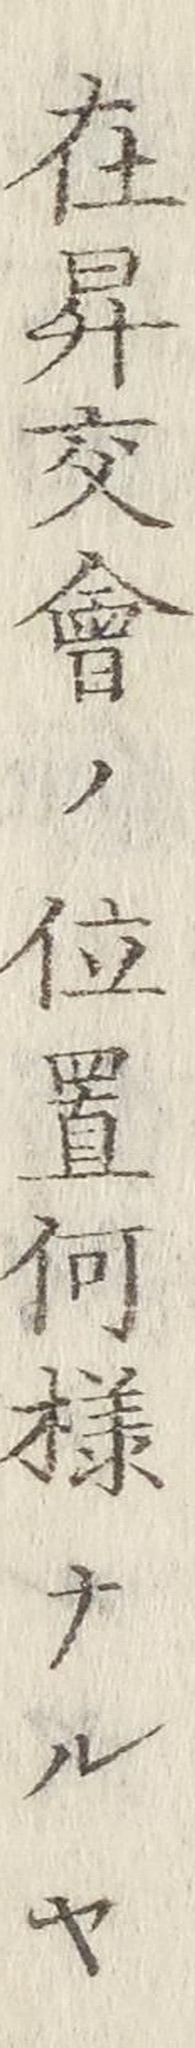在昇交会ノ位置何様ナルヤ
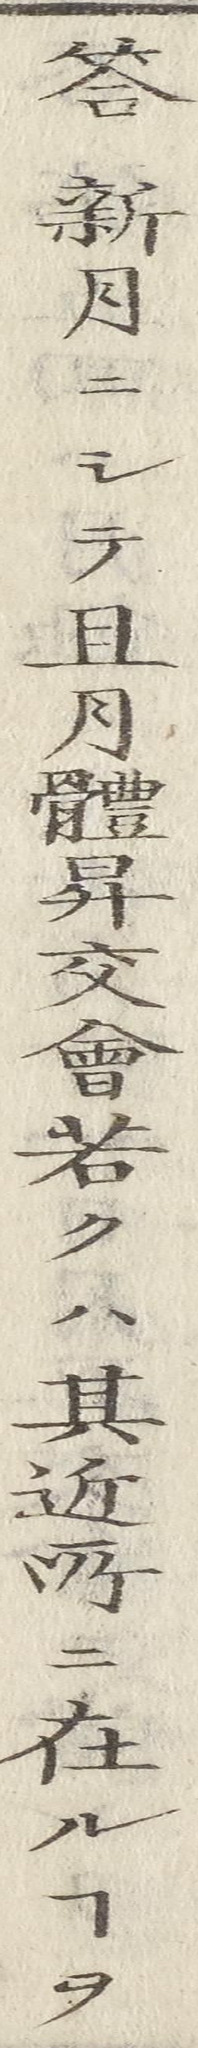答新月ニシテ且月体昇交会若クハ其近所ニ在ルコトヲ
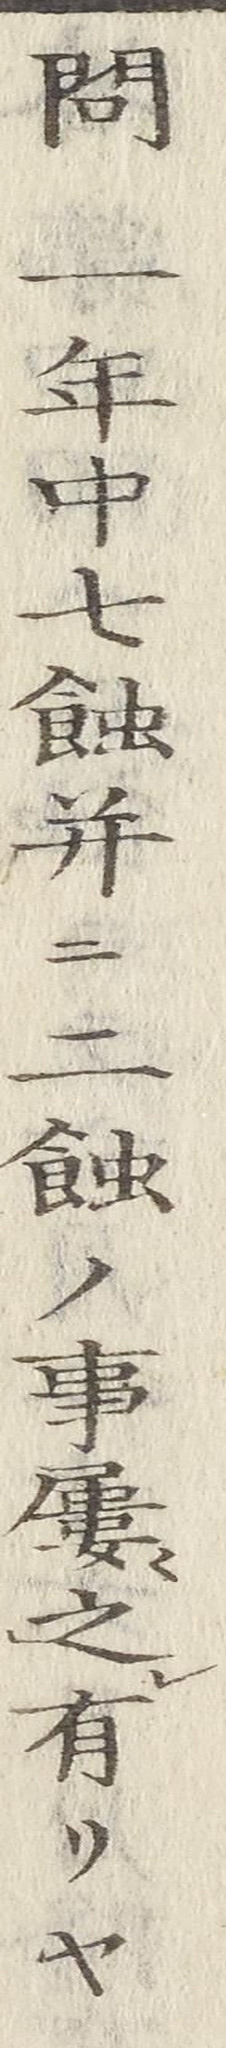問一年中七蝕幷ニ二蝕ノ事婁〱之レ有リヤ
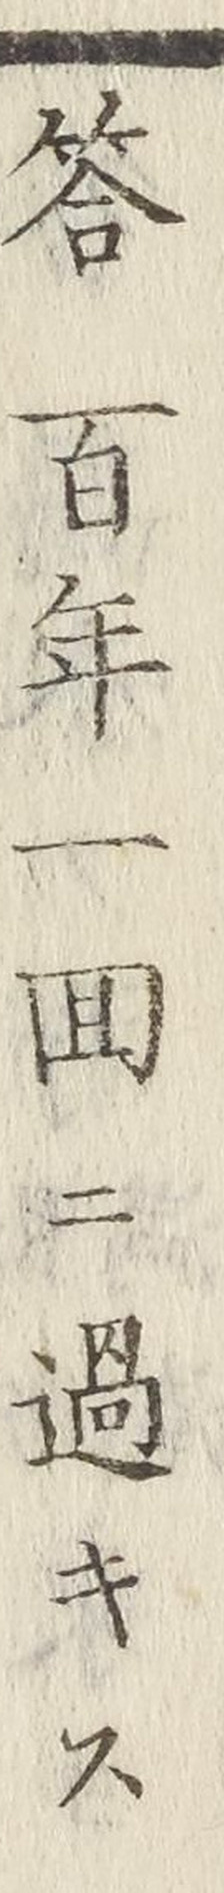答百年一回ニ過キス
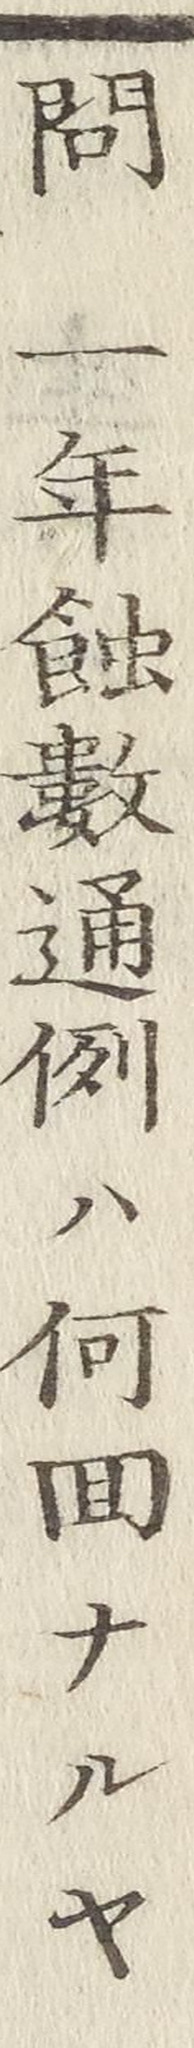問一年蝕数通例ハ何回ナルヤ
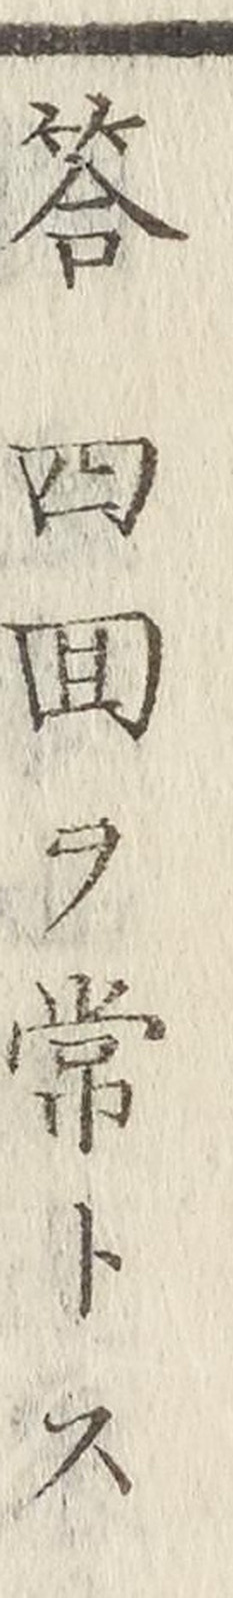答四回ヲ常トス
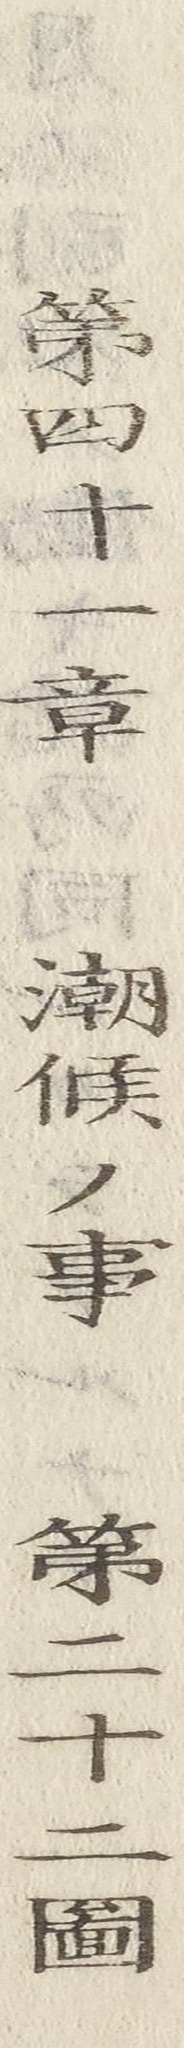第四十一章潮候ノ事第二十二図
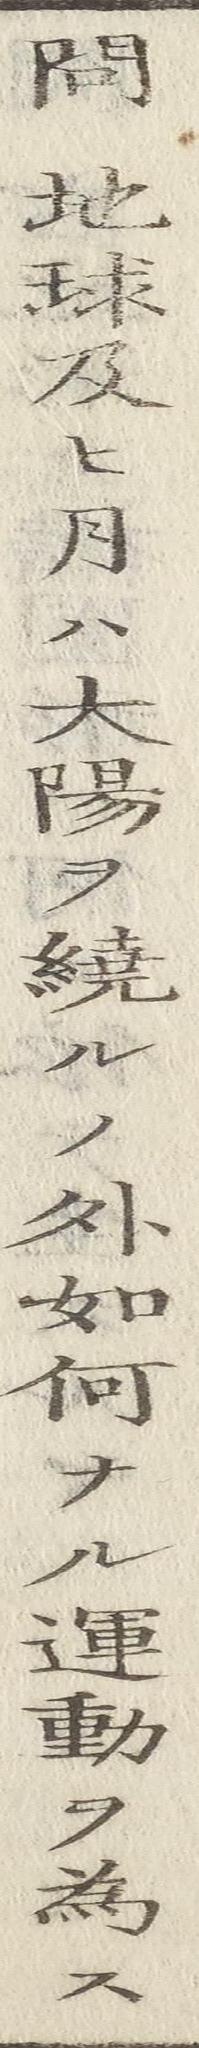問地球及ヒ月ハ大陽ヲ繞ルノ外如何ナル運動ヲ為ス
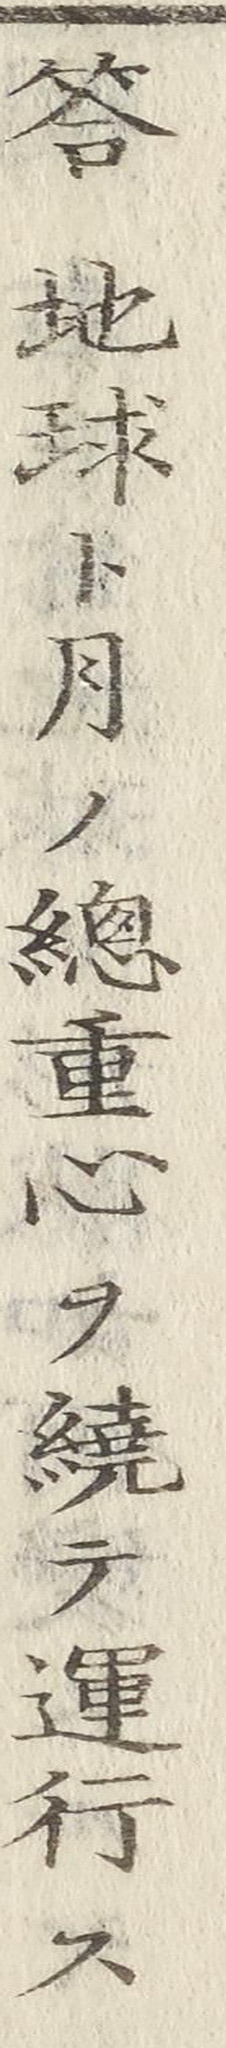答地球ト月ノ総重心ヲ繞テ運行ス
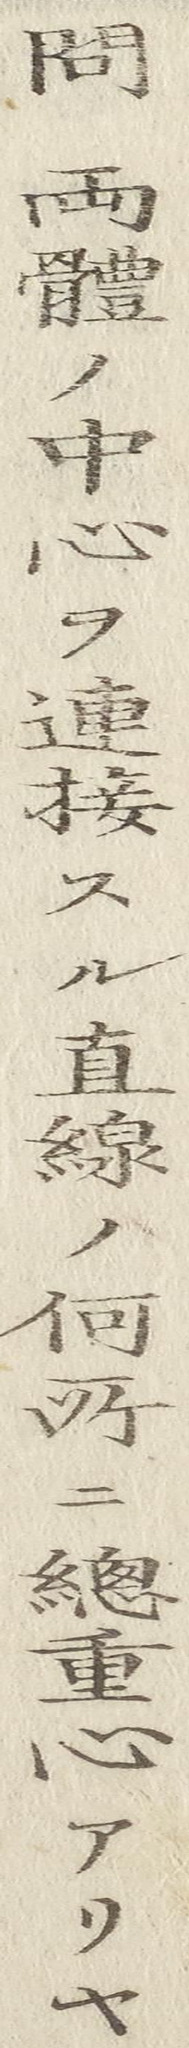問両体ノ中心ヲ連接スル直線ノ何所ニ総重心アリヤ
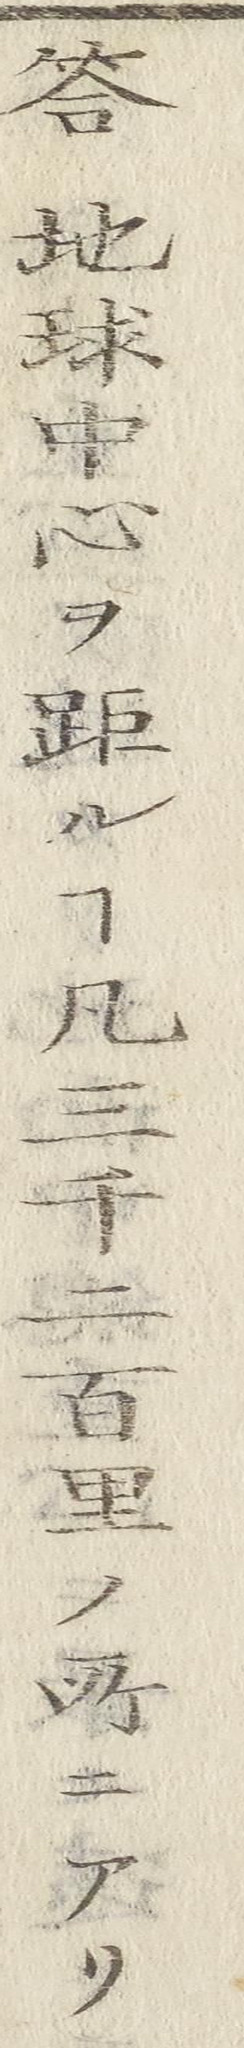答地球中心ヲ距ルコト凡三千二百里ノ所ニアリ
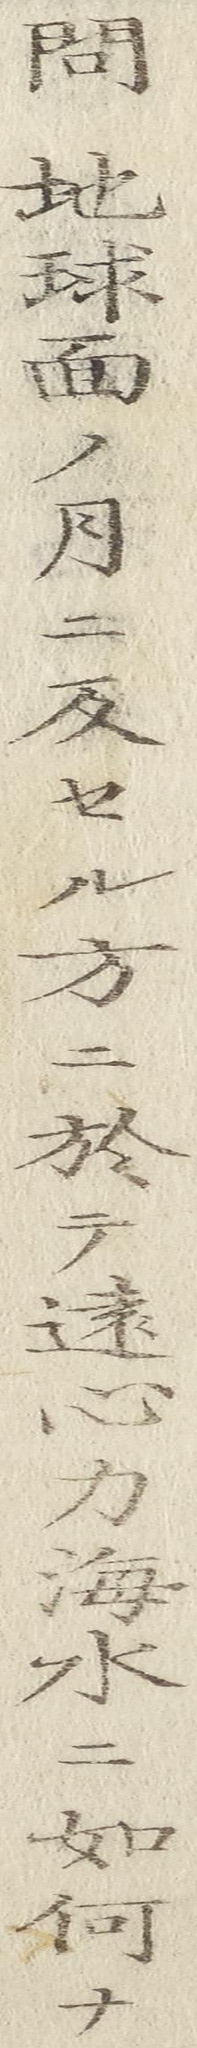問地球面ノ月ニ反セル方ニ於テ遠心力海水ニ如何ナ

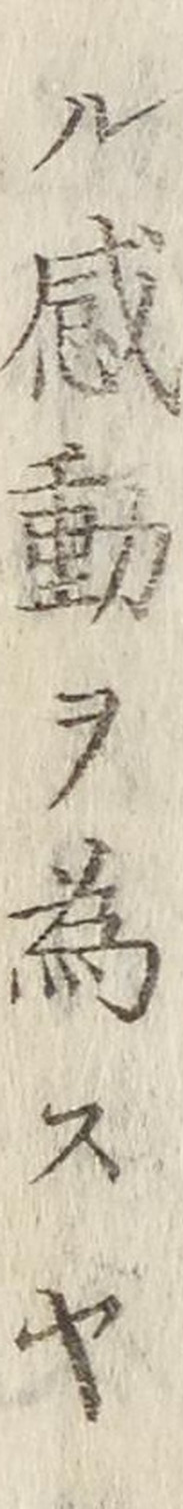ル感動ヲ為スヤ
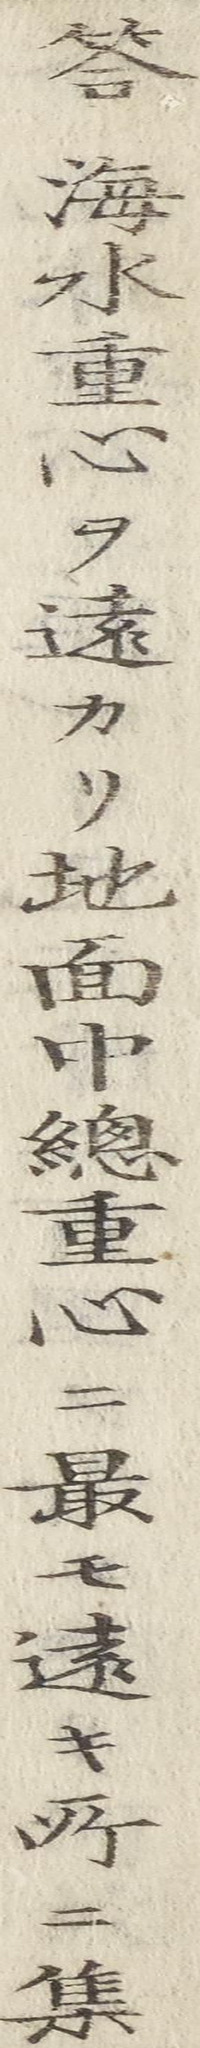答海水重心ヲ遠カリ地面中総重心ニ最モ遠キ所ニ集
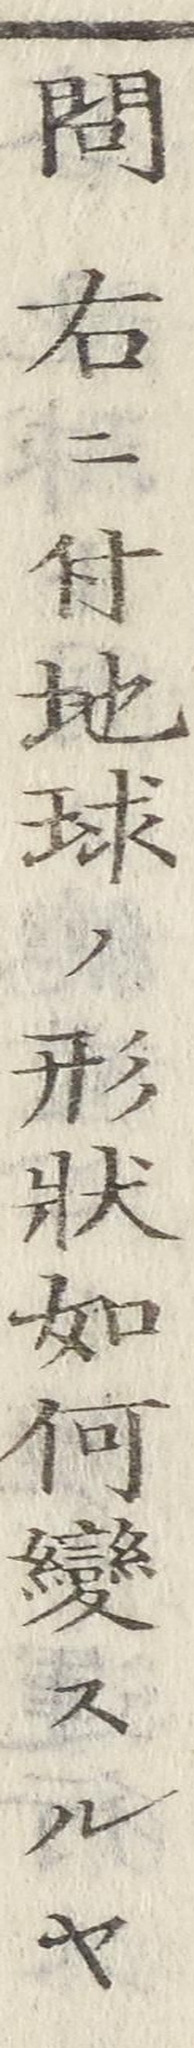問右ニ付地球ノ形状如何変スルヤ
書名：星学圖説　下
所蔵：東京大学地震研究所図書室 Earthquake Research Institute Library, The University of Tokyo, JAPAN
